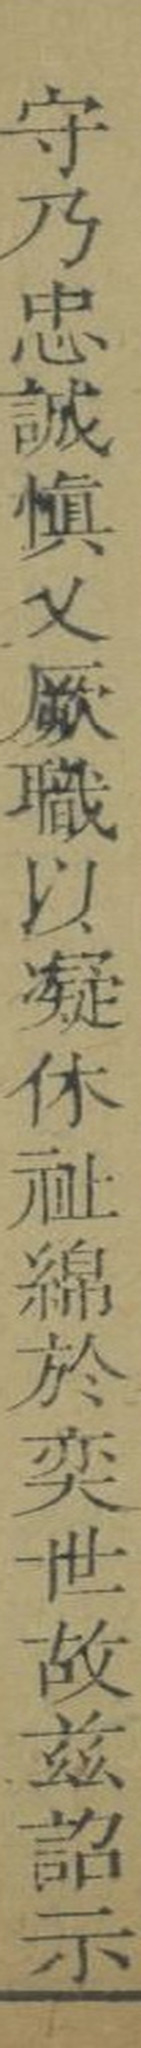守乃忠誠慎乂厥職以凝休祉綿於奕世故茲詔示
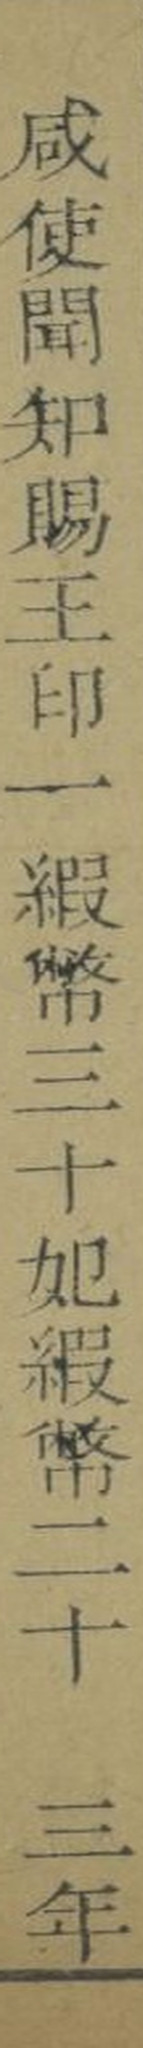咸使聞知賜王印一緞幣三十妃緞幣二十三年
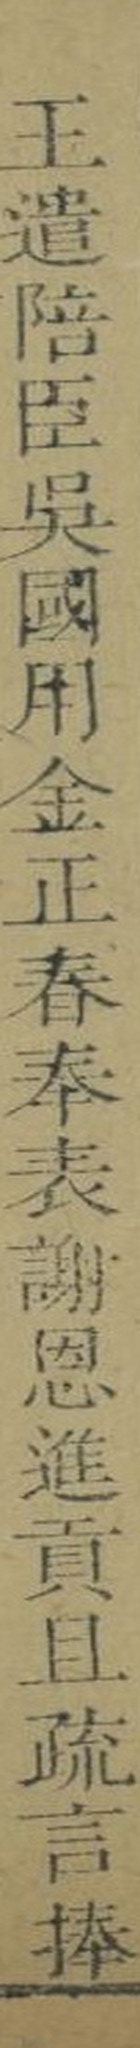王遣陪臣呉国用金正春奉表謝恩進貢且疏言捧
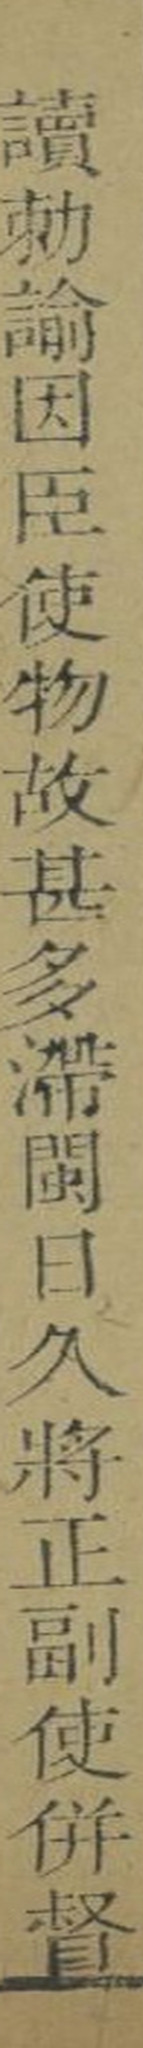読勅諭因臣使物故甚多滞閩日久将正副使併督
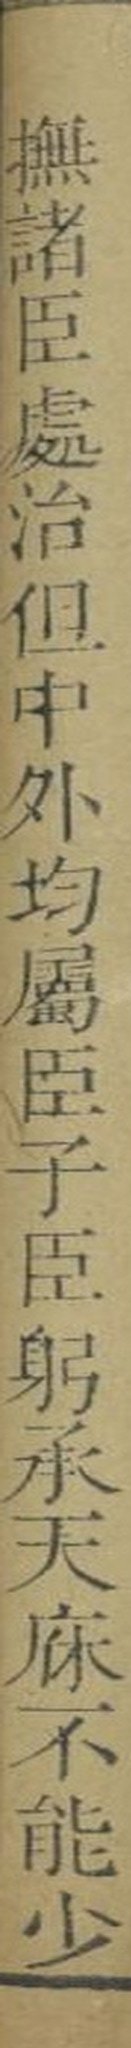撫諸臣処治但中外均属臣子臣躬承天庥不能少
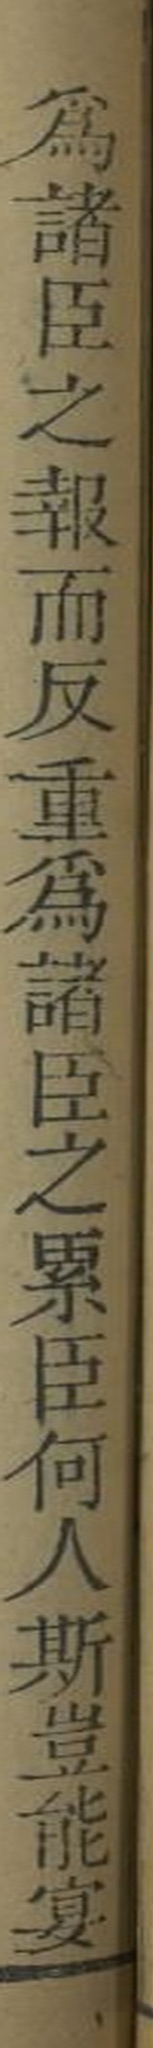為諸臣之報而反重為諸臣之累臣何人斯豈能宴
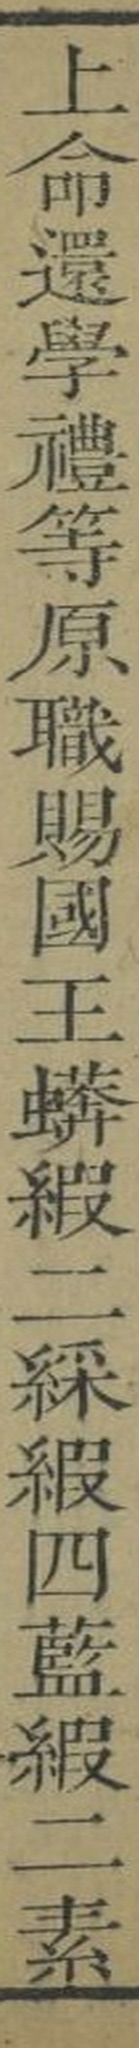上命還学礼等原職賜国王蠎緞二綵緞四藍緞二素
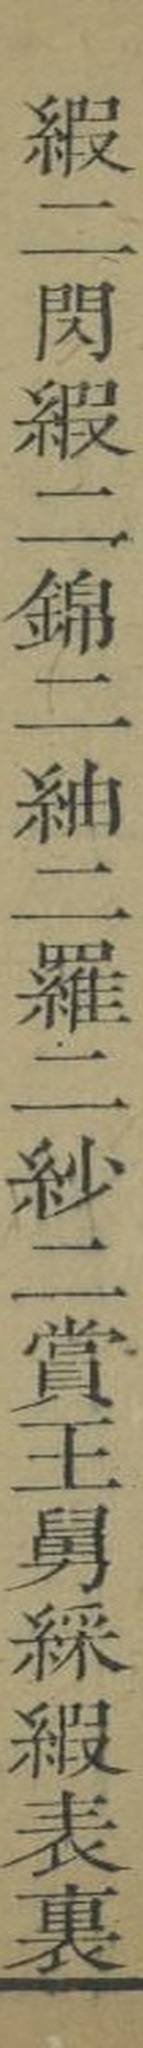緞二緞二錦二紬二羅二紗二賞王舅綵緞表裏
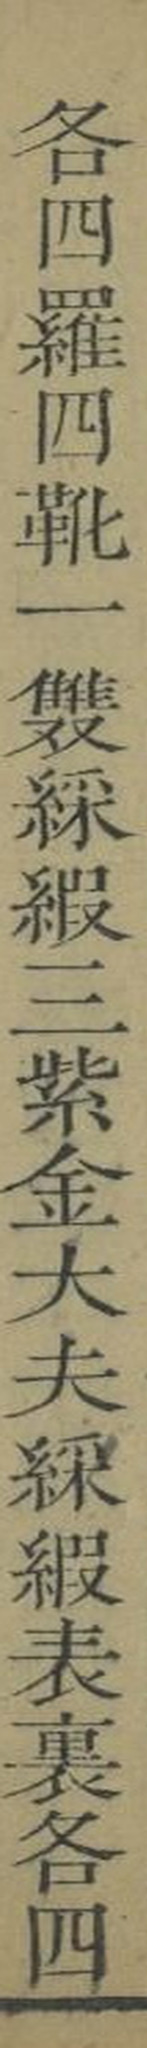各四羅四靴一双綵緞三紫金大夫綵緞表裏各四
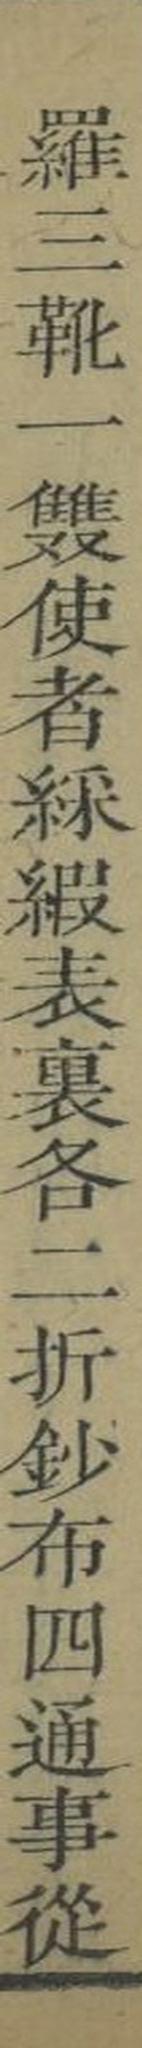羅三靴一双使者綵緞表裏各二折鈔布四通事従
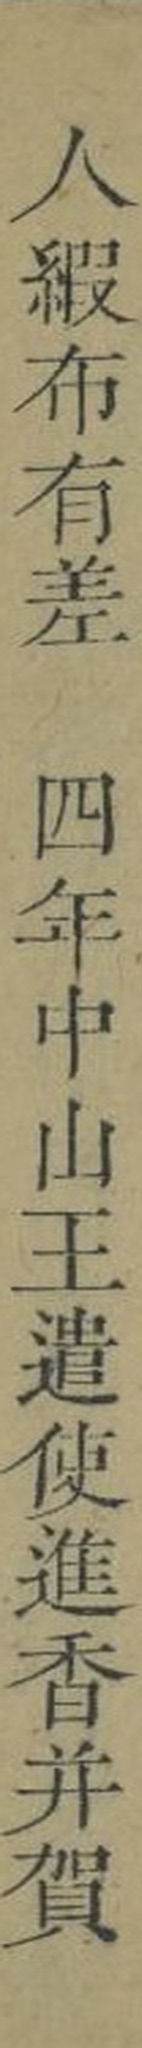人緞布有差四年中山王遣使進香幷賀
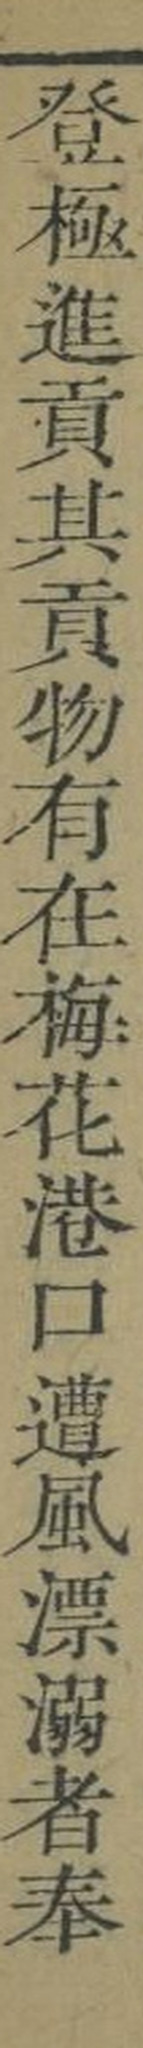登極進貢其貢物有在梅花港口遭風漂溺者奉
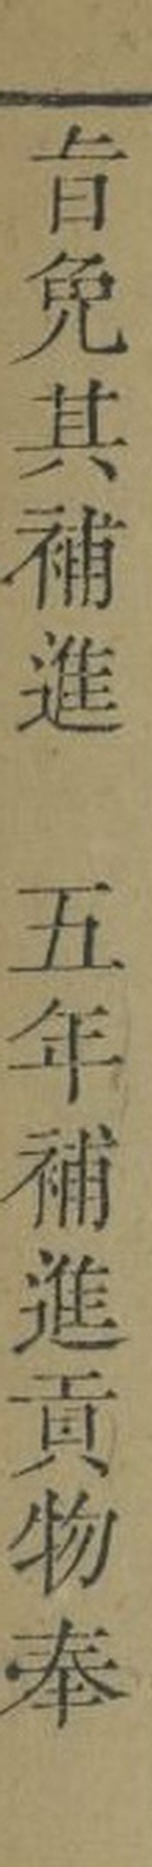旨免其補進五年補進貢物奉

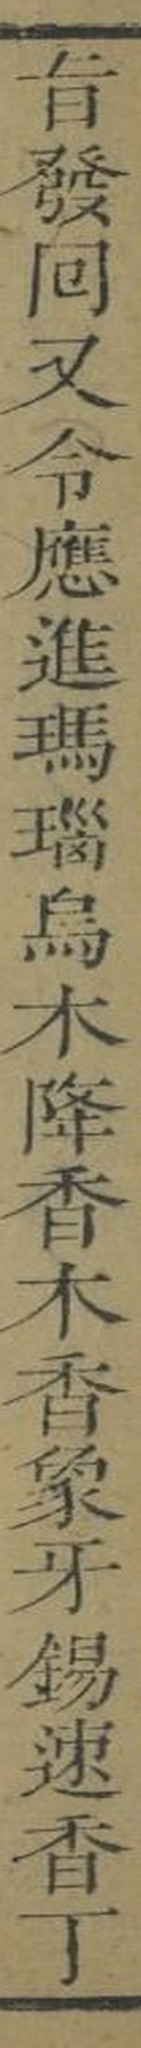旨発回又令応進瑪瑙烏木降香木香象牙錫速香丁
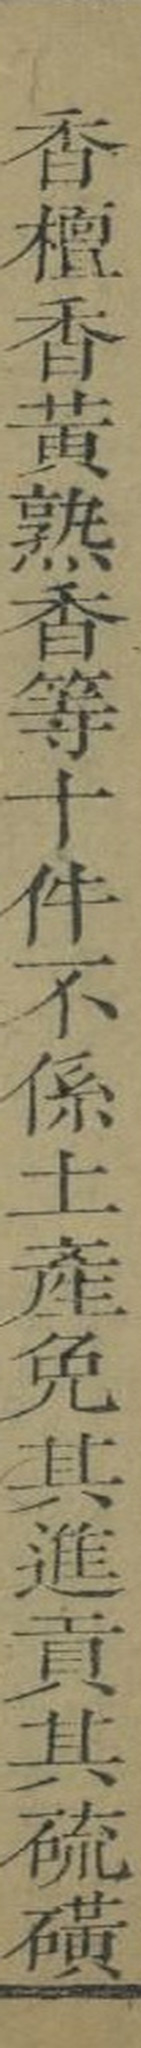香檀香黄熟香等十件不係土産免其進貢其硫磺
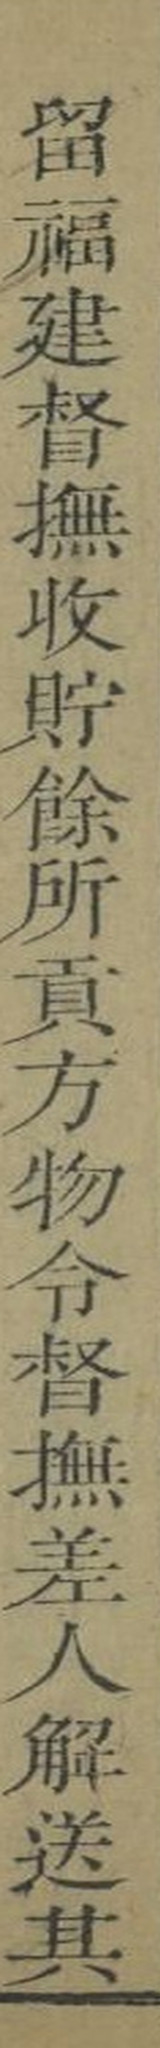留福建督撫収貯余所貢方物令督撫差人解送其
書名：中山伝信録 巻四
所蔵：University of the Ryukyus Library
